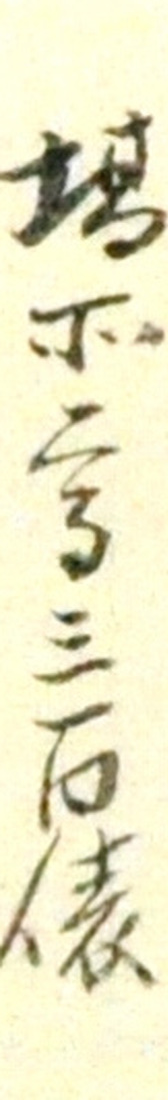場所高三石俵
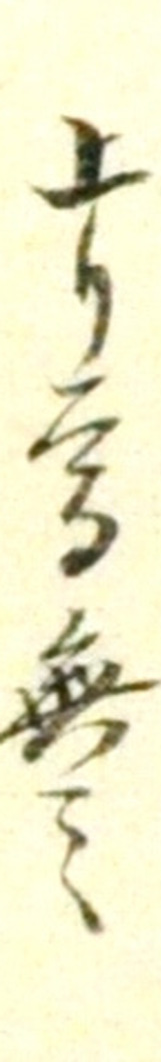上り高無之
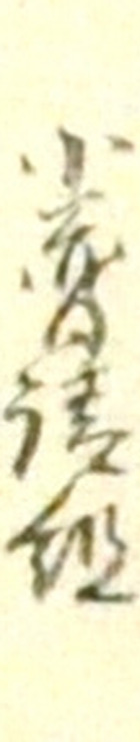小普請組
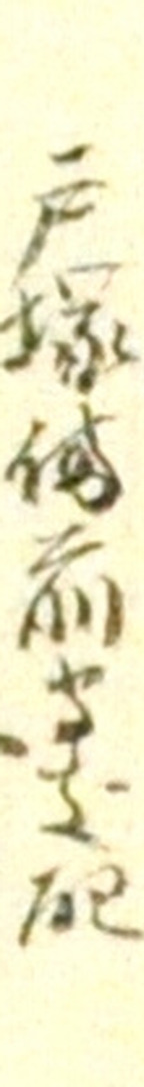戸塚備前守支配
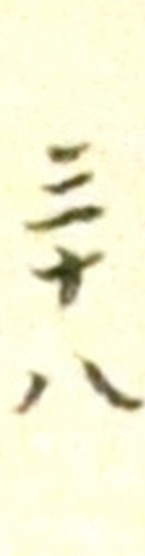三十八
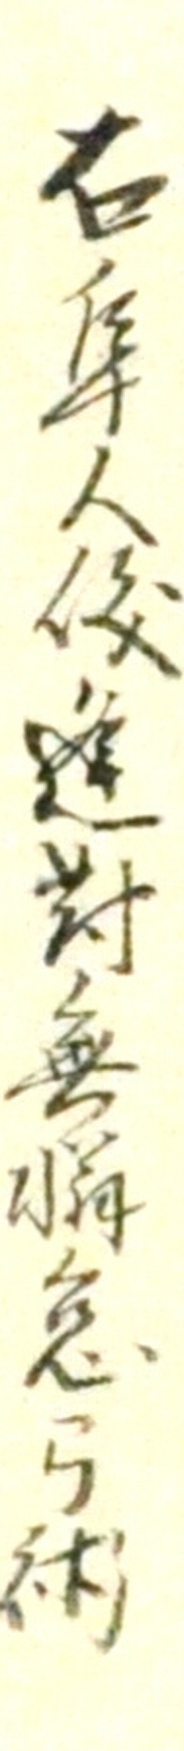右隼人儀逢対無懈怠弓術
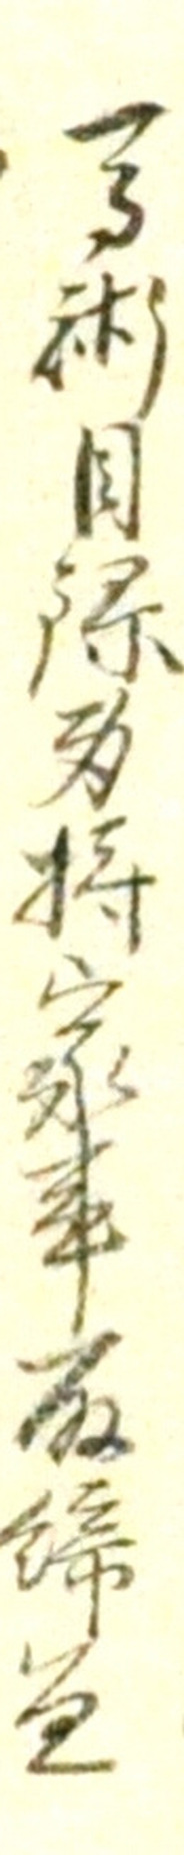馬術目録身持家事取締宜
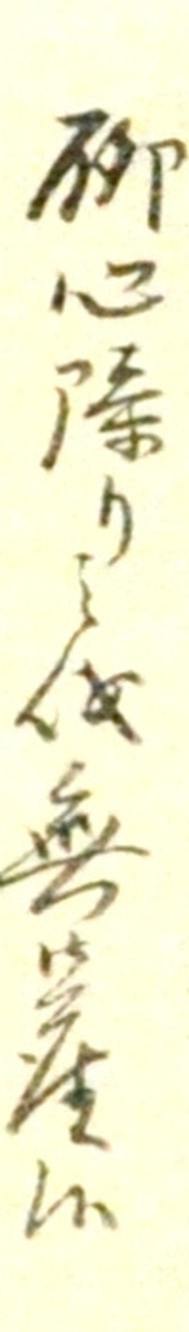聊心障り之儀無御座候
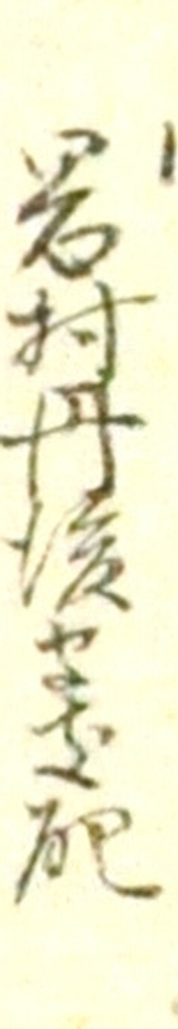岡村丹後守支配
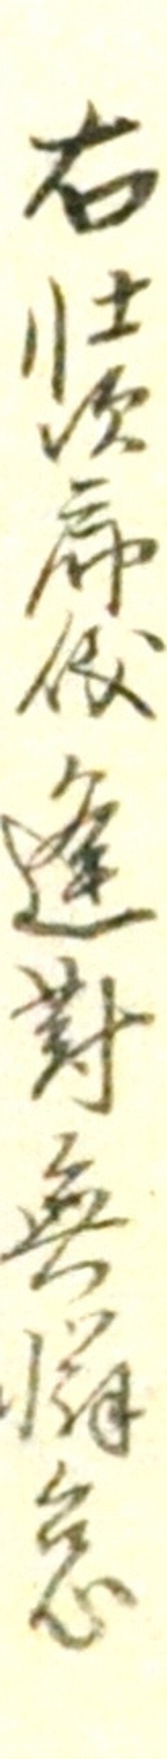右壮次郎儀逢対無懈怠
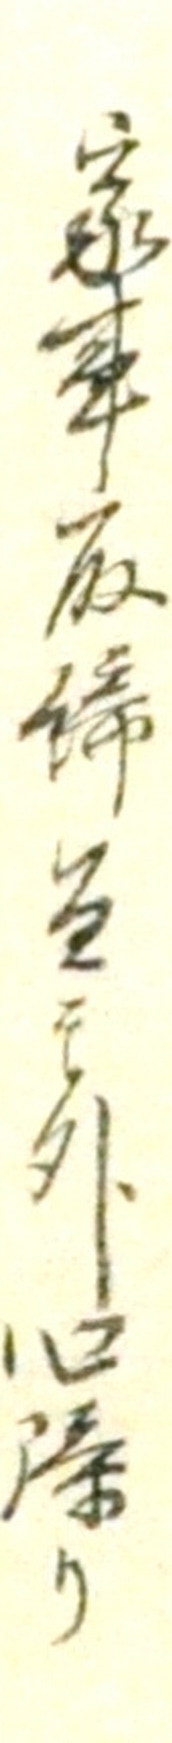家事取締宜其外心障り
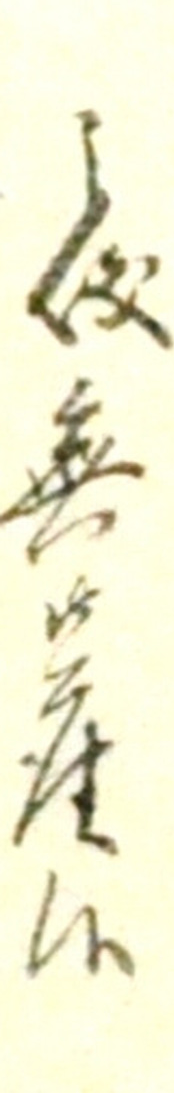之儀無御座候
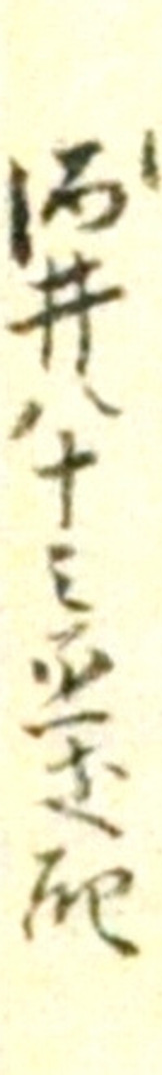酒井八十之丞支配
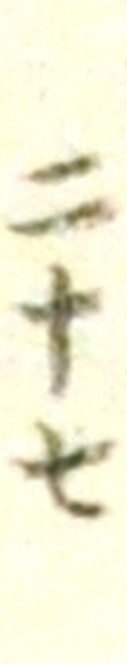二十七
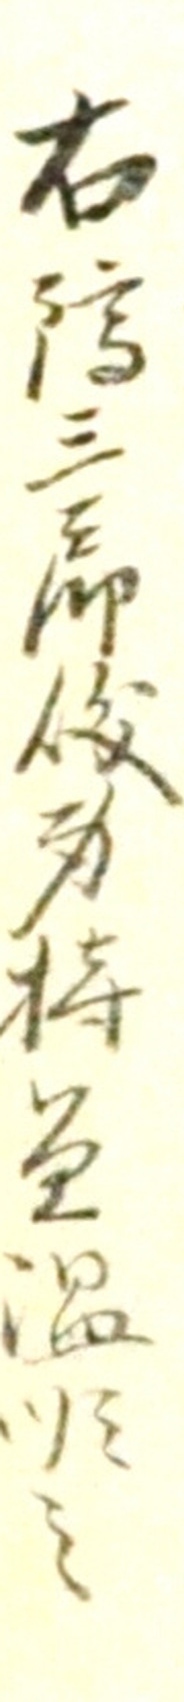右鎬三郎儀身持宜温順之
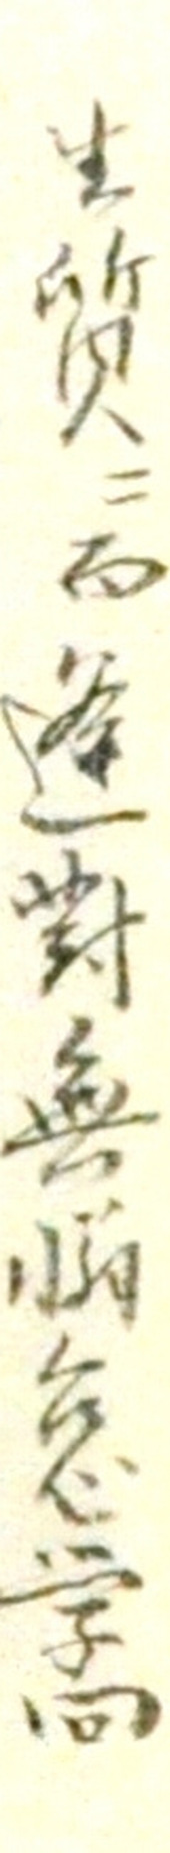生質にて逢対無懈怠学問
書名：下調
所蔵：伊那市立高遠町図書館・合同会社AMANE
